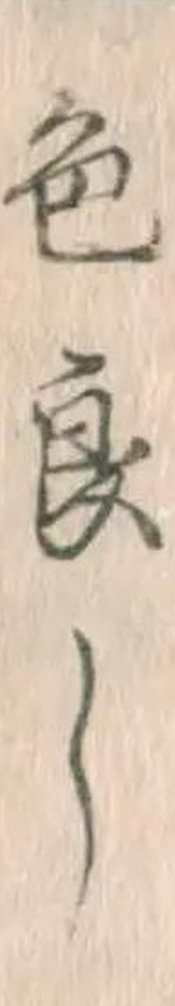色良し
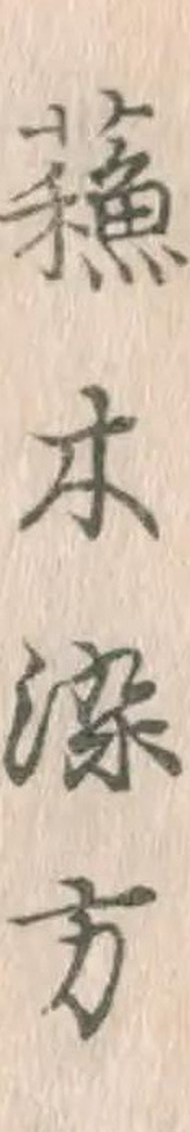蘓木染方
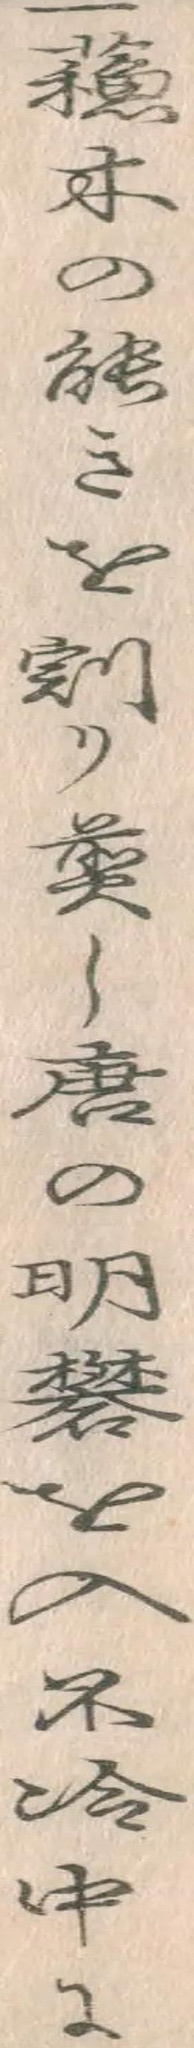一蘓木の能きを割り煎し唐の明礬を入不冷中に
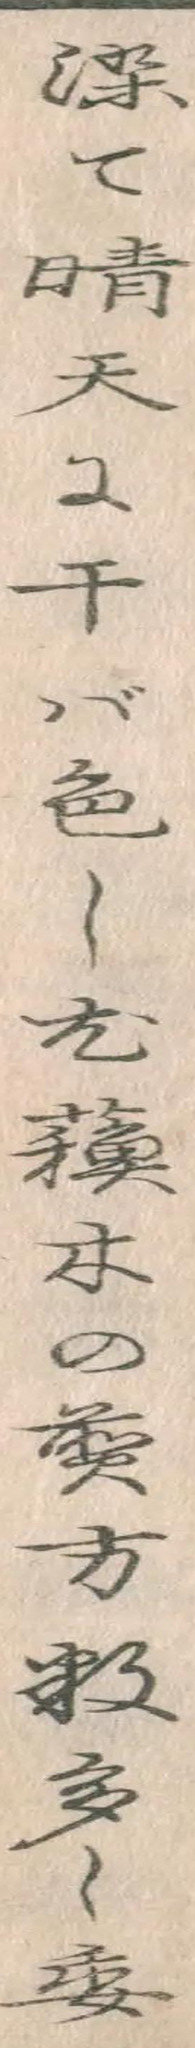染て晴天に干ば色し尤蘓木の煎方数多し委
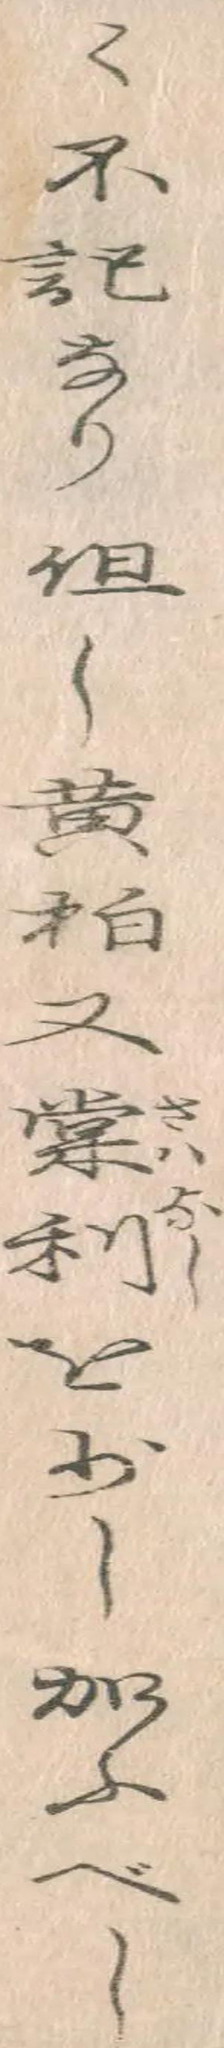く不記なり但し黄柏又棠利を少し加ふべし
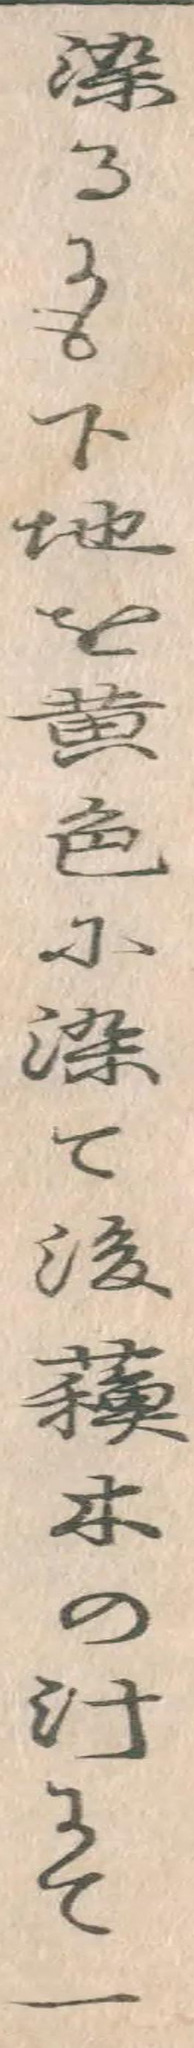染るにも下地を黄色に染て後蘓木の汁にて一
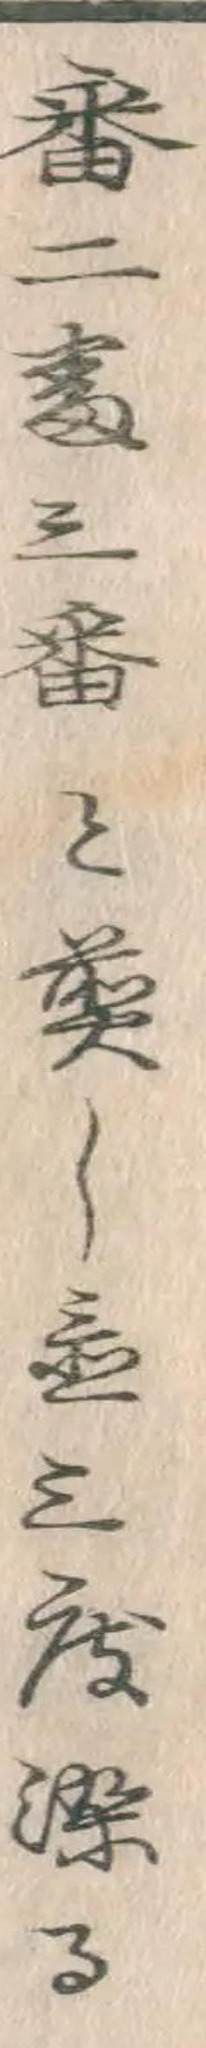番二番三番と煎し置三度染る
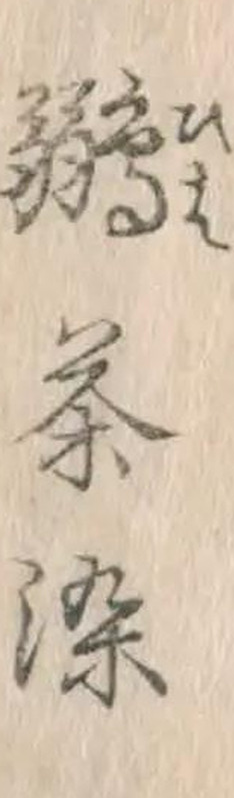鶸茶染

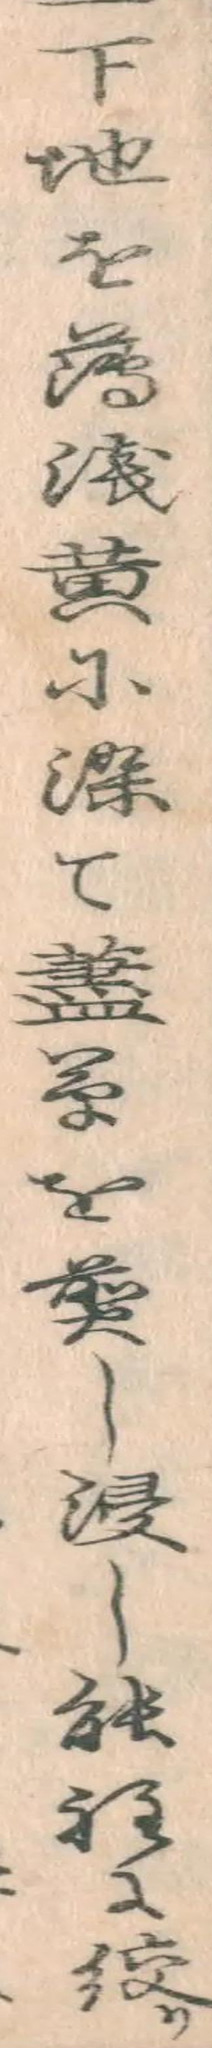一下地を薄浅黄に染て藎草を煎し浸し能程に絞り
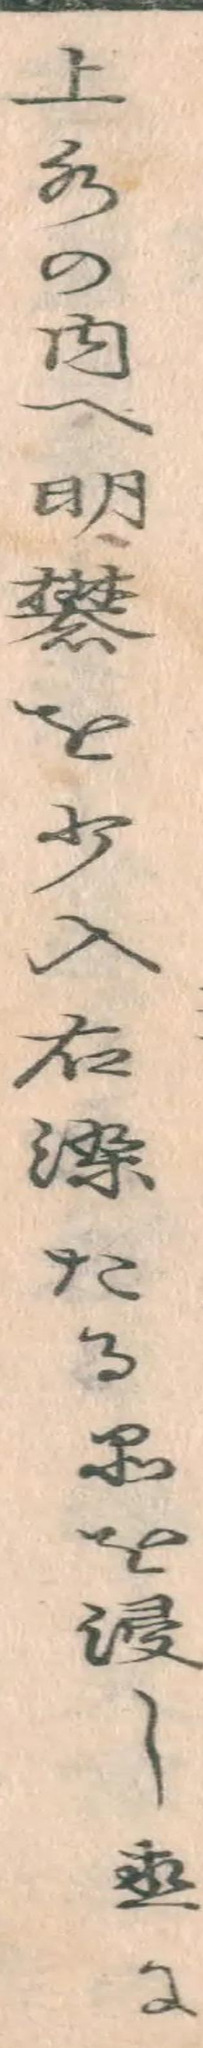上水の内へ明礬を少入右染たる品を浸し直に
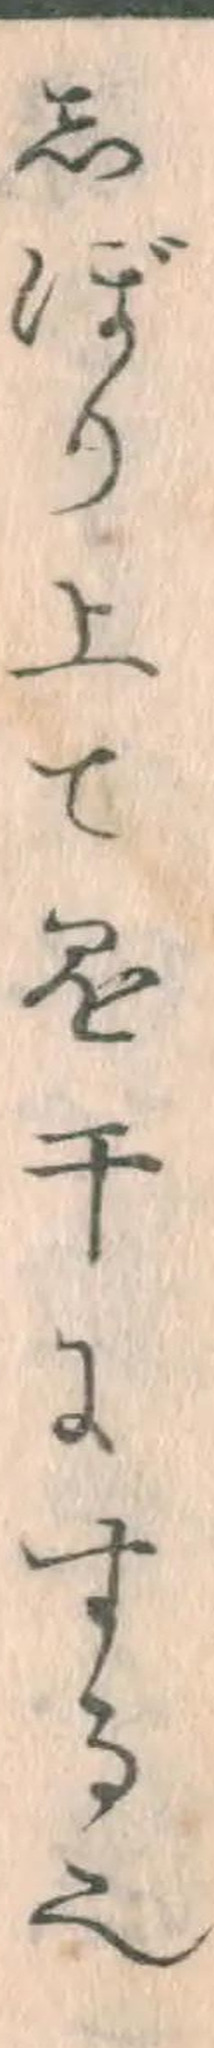しぼり上て懸干にする也
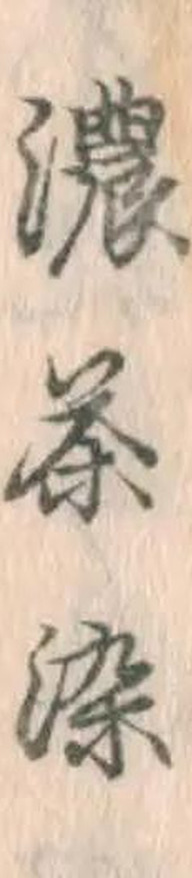濃茶染
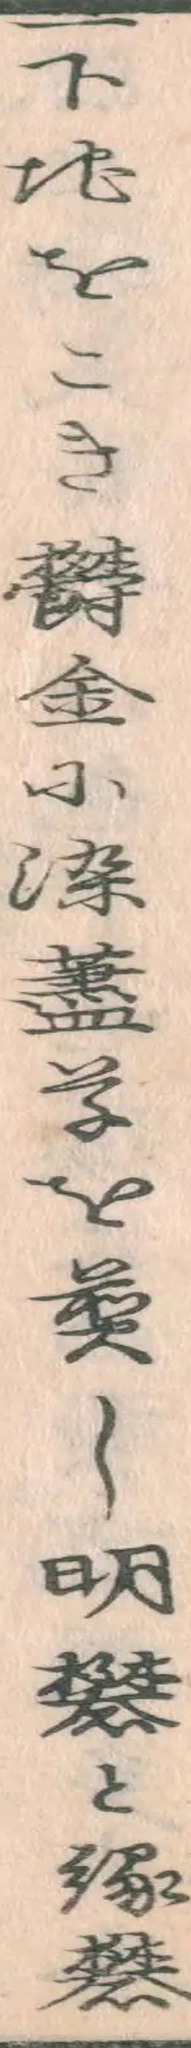一下地をこき鬱金に染藎草を煎し明礬と緑礬
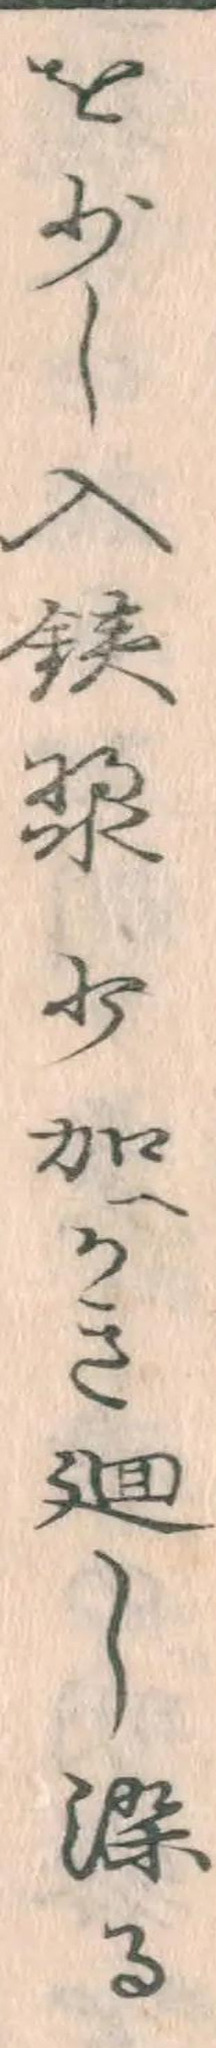を少し入鉄漿少加へかき廻し染る
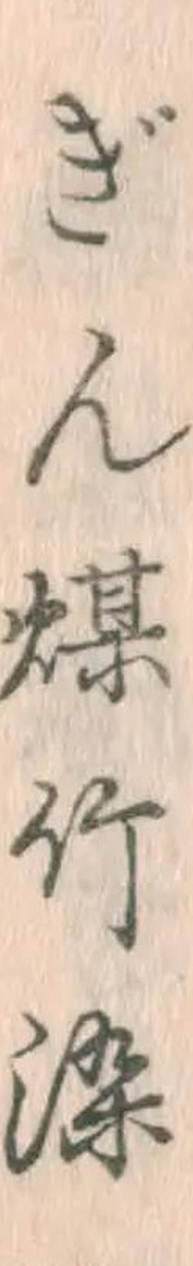ぎん煤竹染
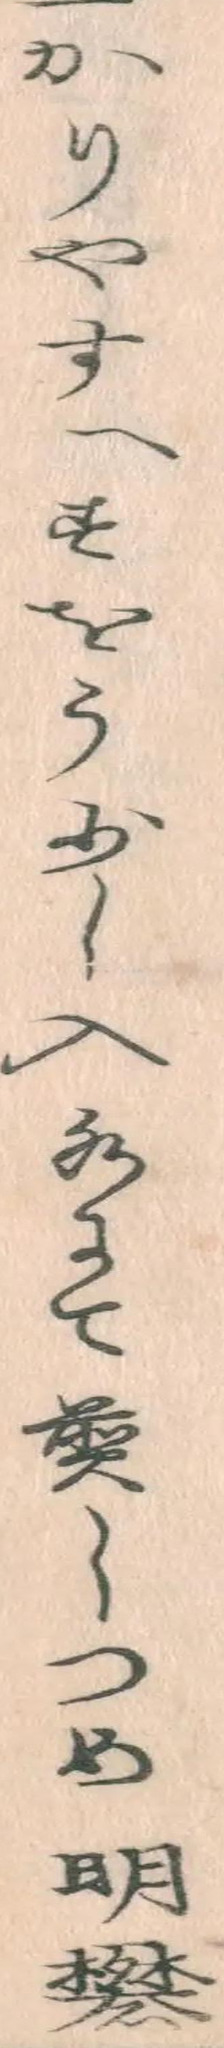一かりやすへすをう少し入水にて煎しつめ明礬
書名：機織彙編 5巻. [1]
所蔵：国立国会図書館 National Diet Library, JAPAN
